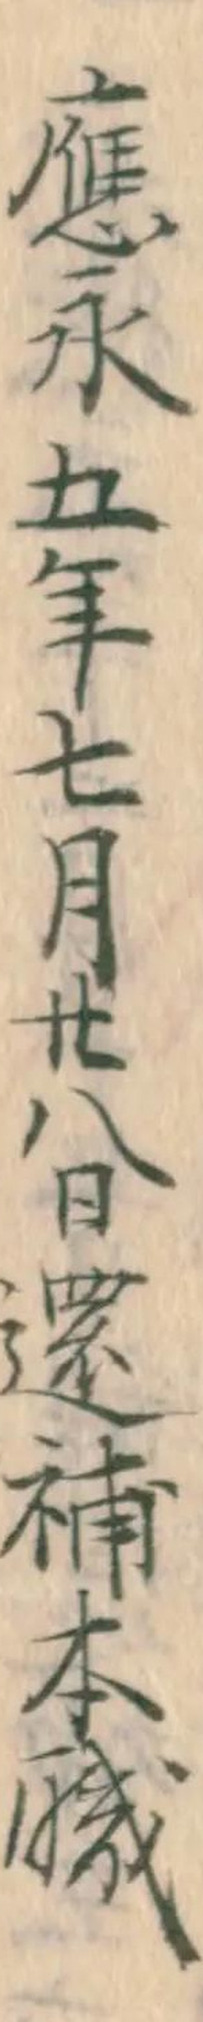豊久応永五年七月廿八日還補本職
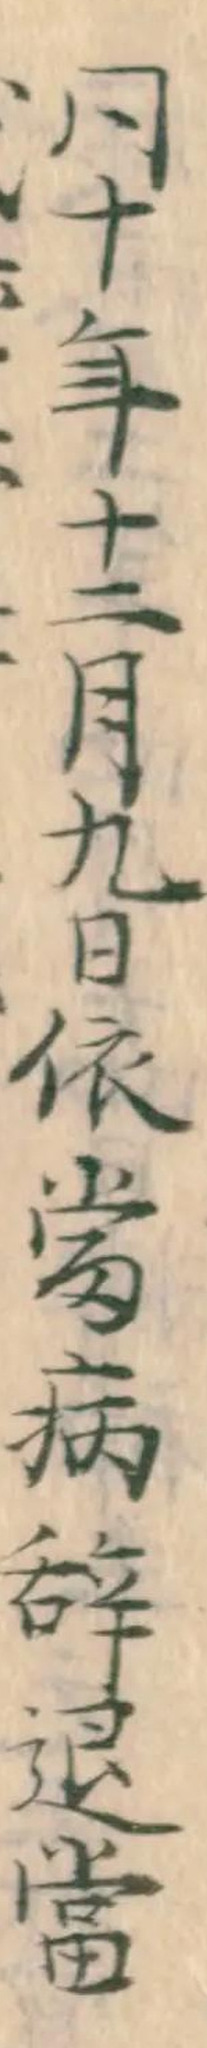同十年十二月九日依当病辞退当
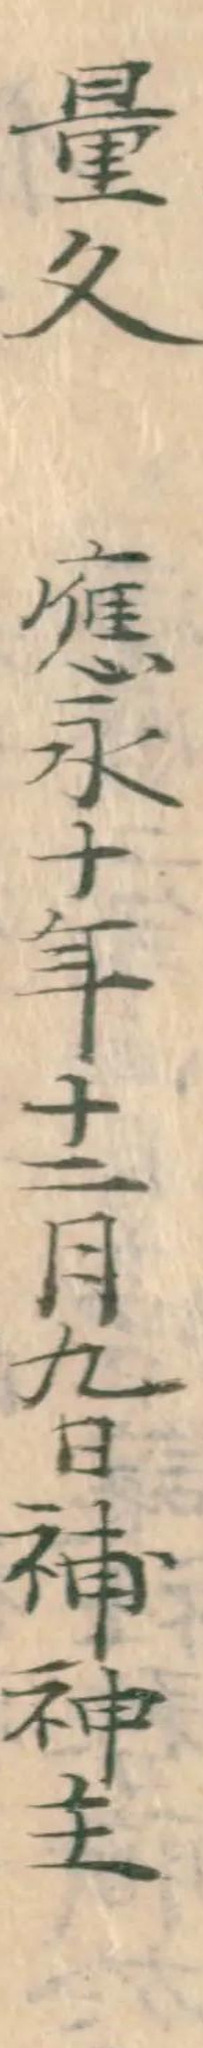量久応永十年十二月九日補神主
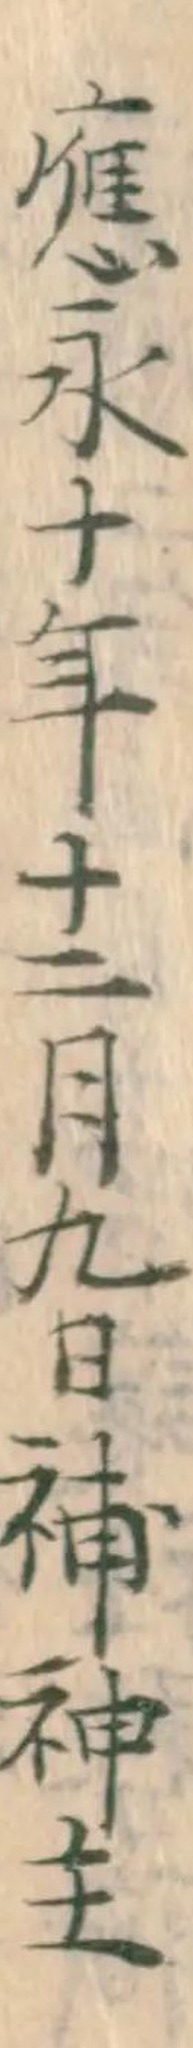量久応永十年十二月九日補神主
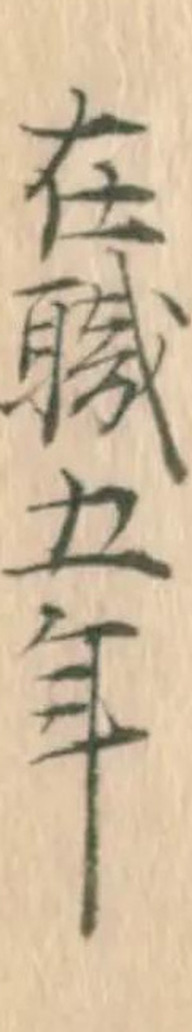在職五年
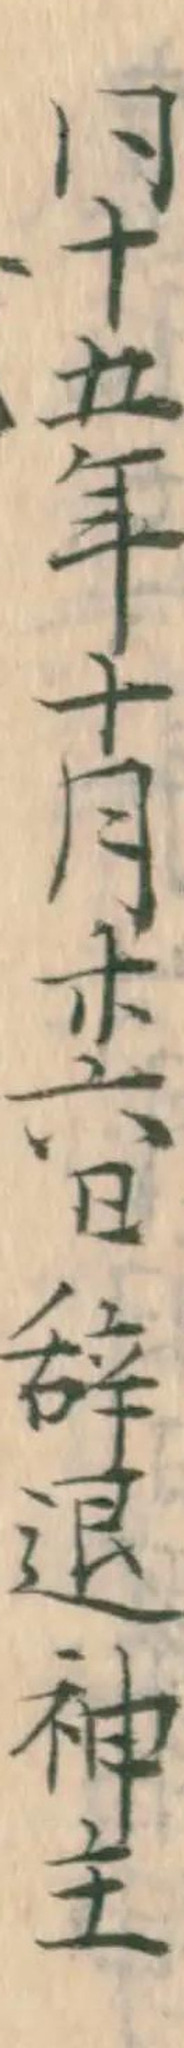同十五年十月廿六日辞退神主
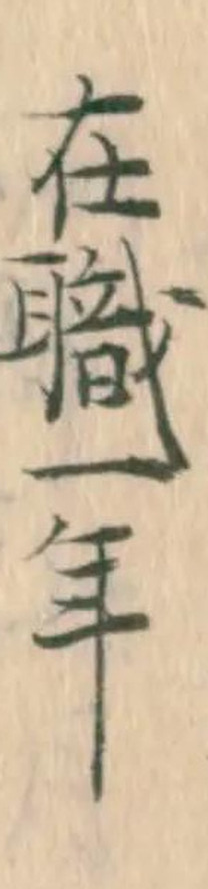在職一年
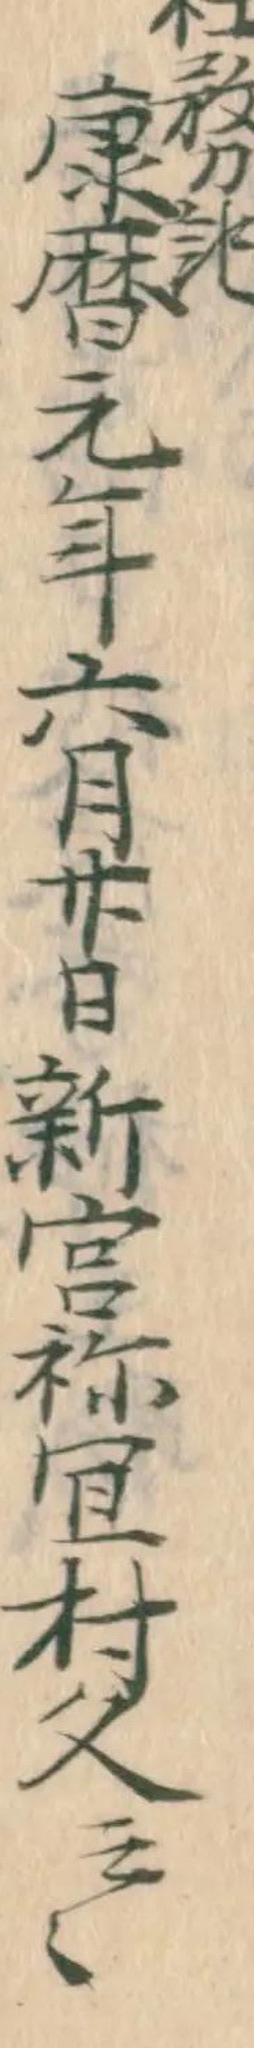村久康暦元年六月廿日新宮祢宜村久云々
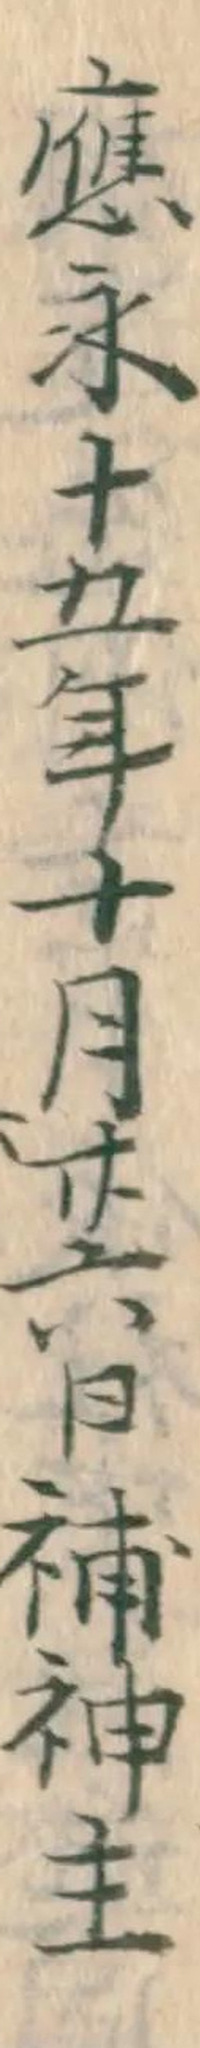応永十五年十月廿六日補神主
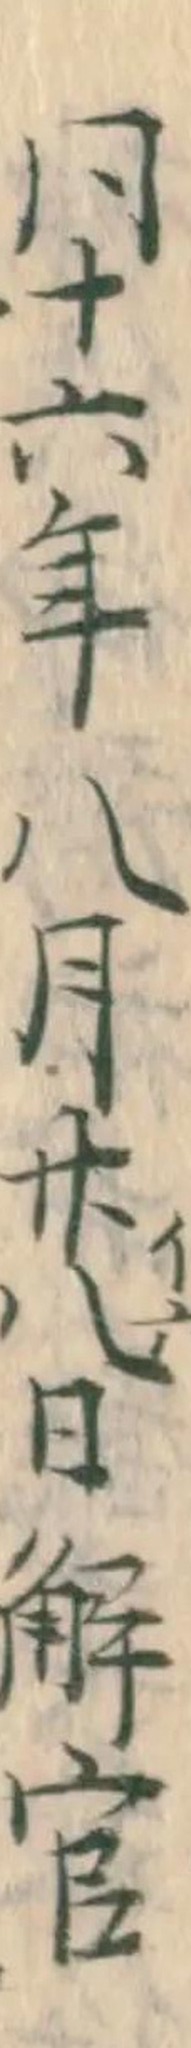同十六年八月廿八日解官
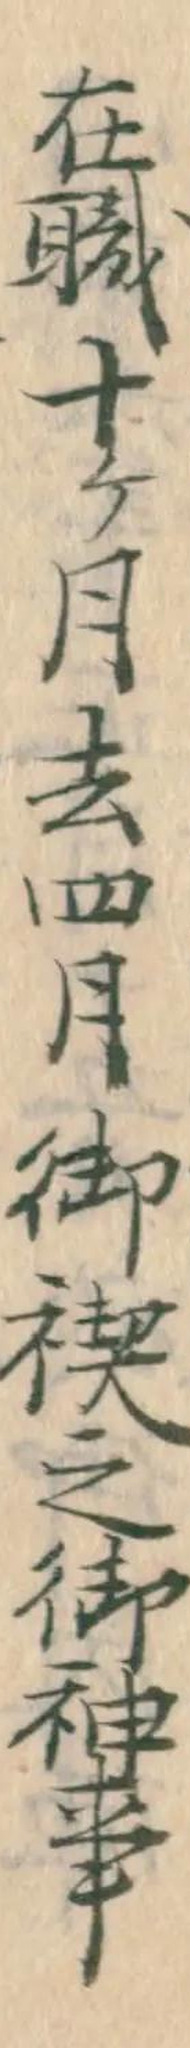在職十ヶ月去四月御禊之御神事
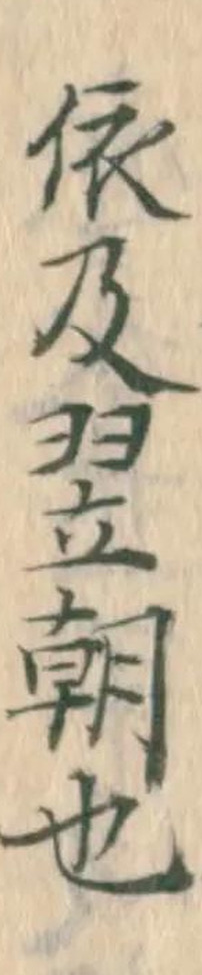依及翌朝也
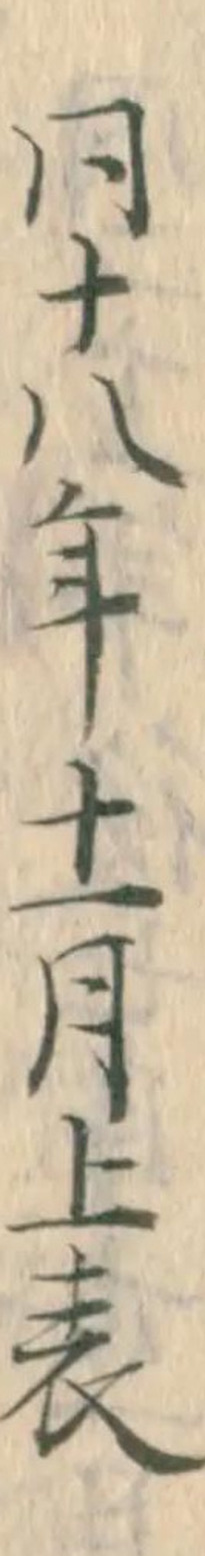同十八年十一月上表
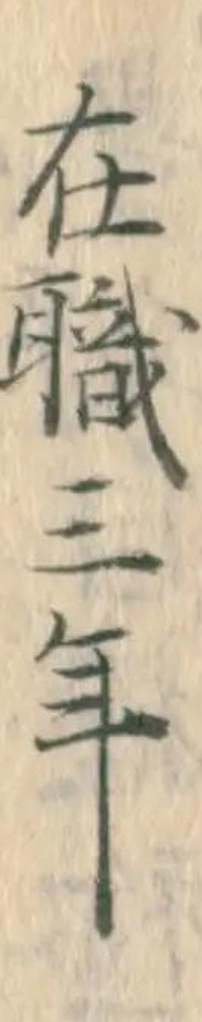在職三年
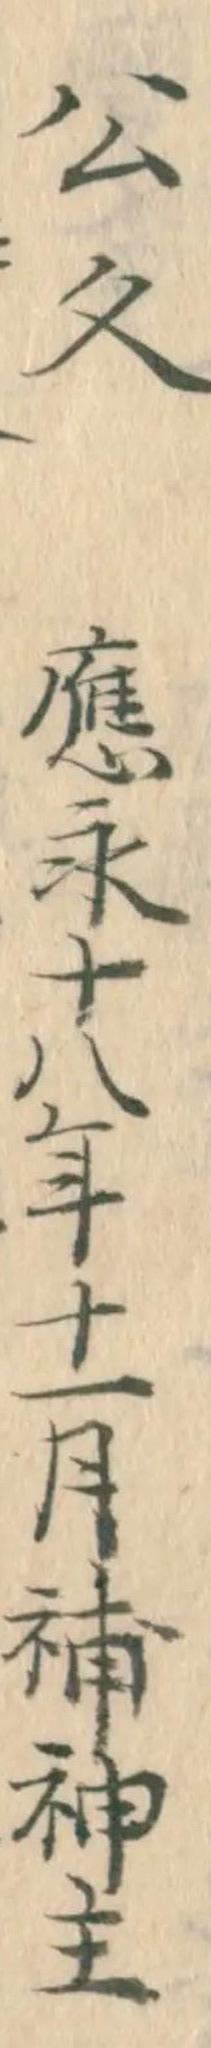公久応永十八年十一月補神主

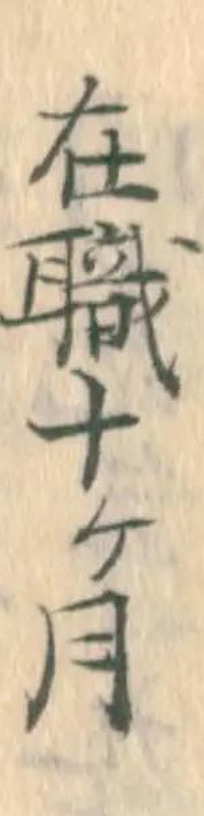在職十ヶ月
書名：賀茂社記録. 第23冊
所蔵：国立国会図書館 National Diet Library, JAPAN
